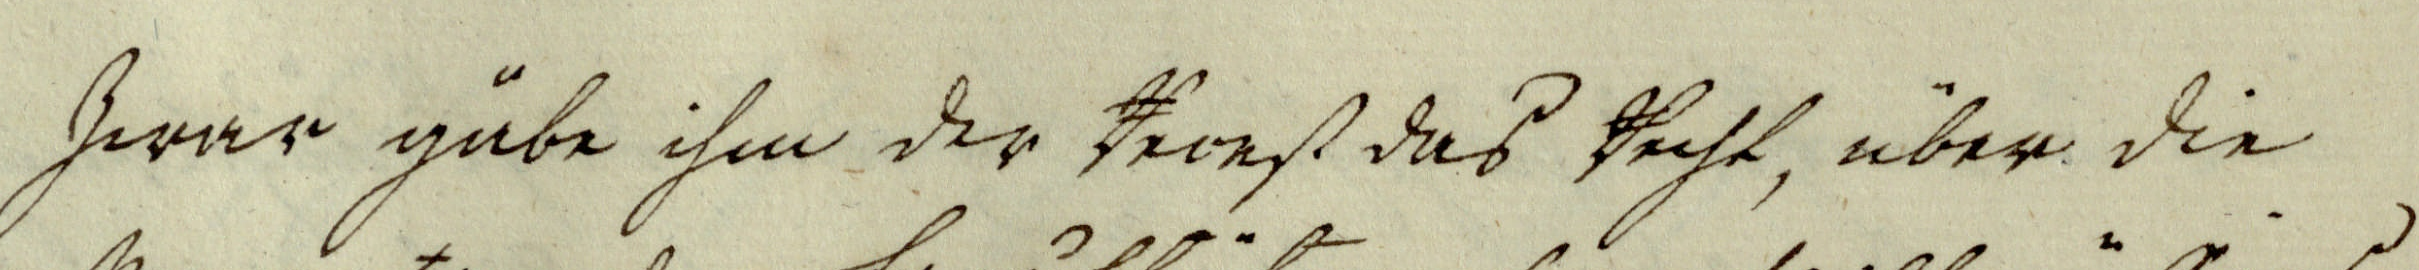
Zwar gäbe ihm der Receß das Recht, über die
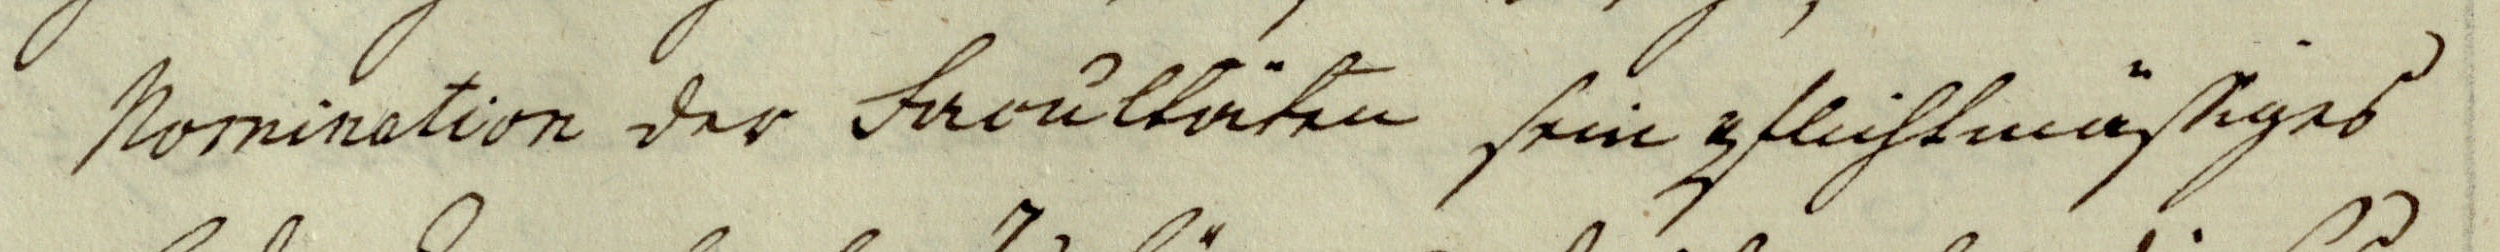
Nomination der Facultäten sein pflichtmässiges
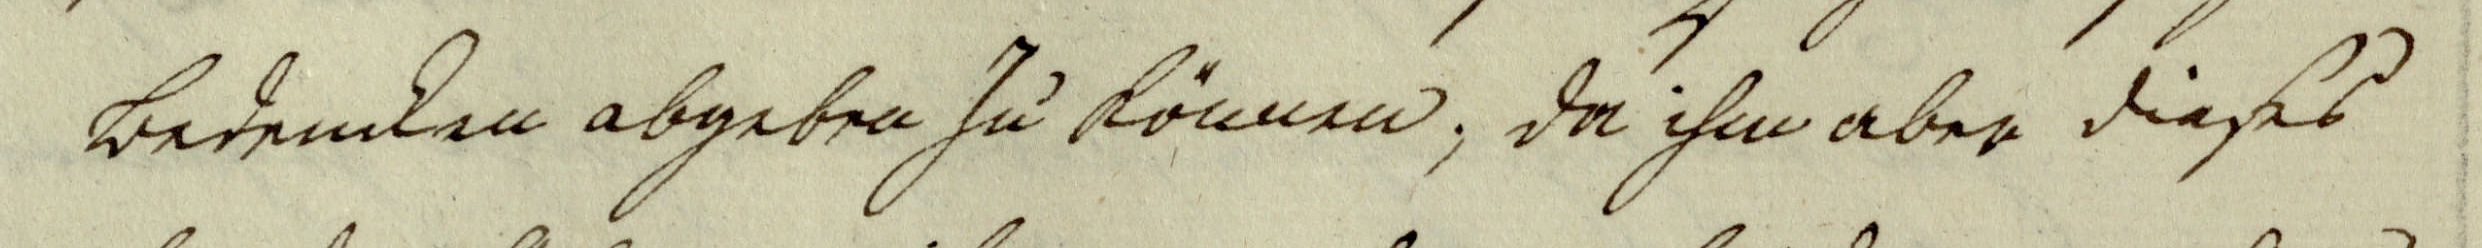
Bedencken abgeben zu können, da ihm aber dieses
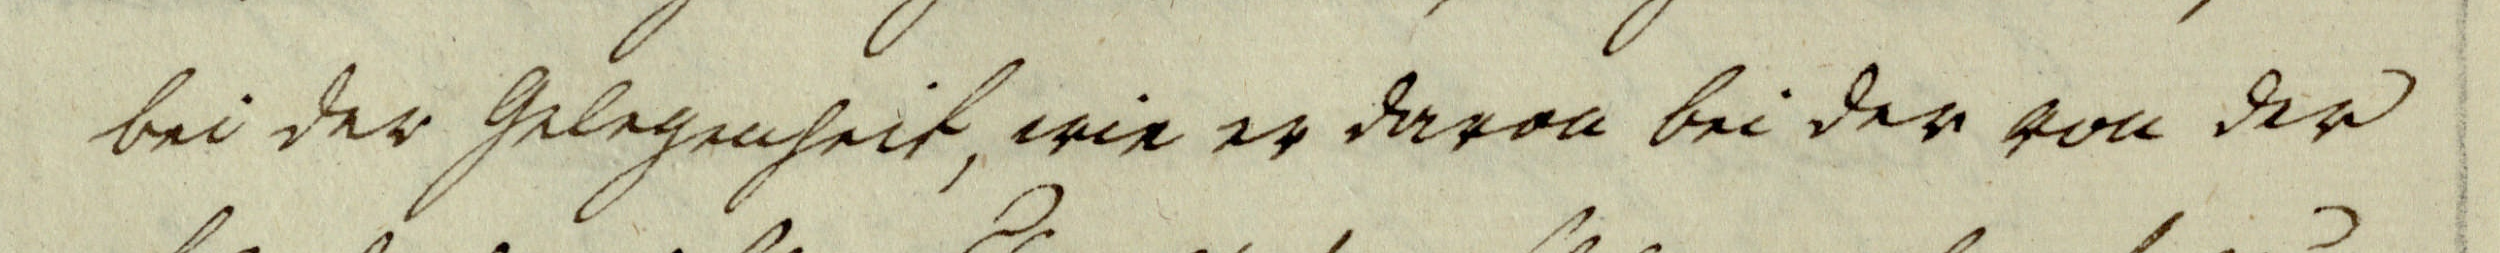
bei der Gelegenheit, wie er davon bei der von der
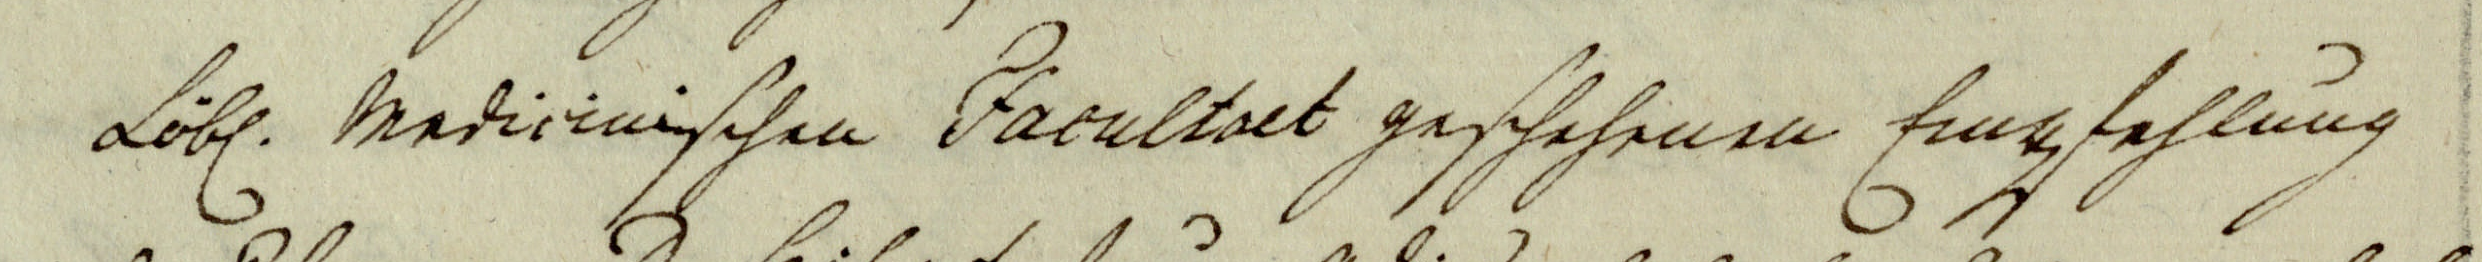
Löbl. Medicinischen Facultaet geschehenen Empfehlung
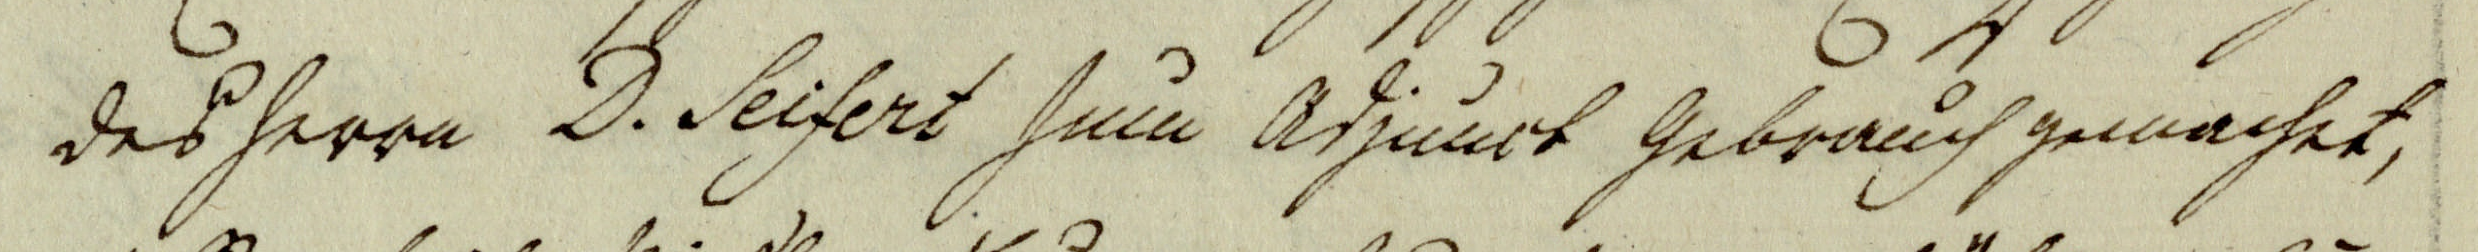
des Herrn D. Seifert zum Adjunct Gebrauch gemachet,
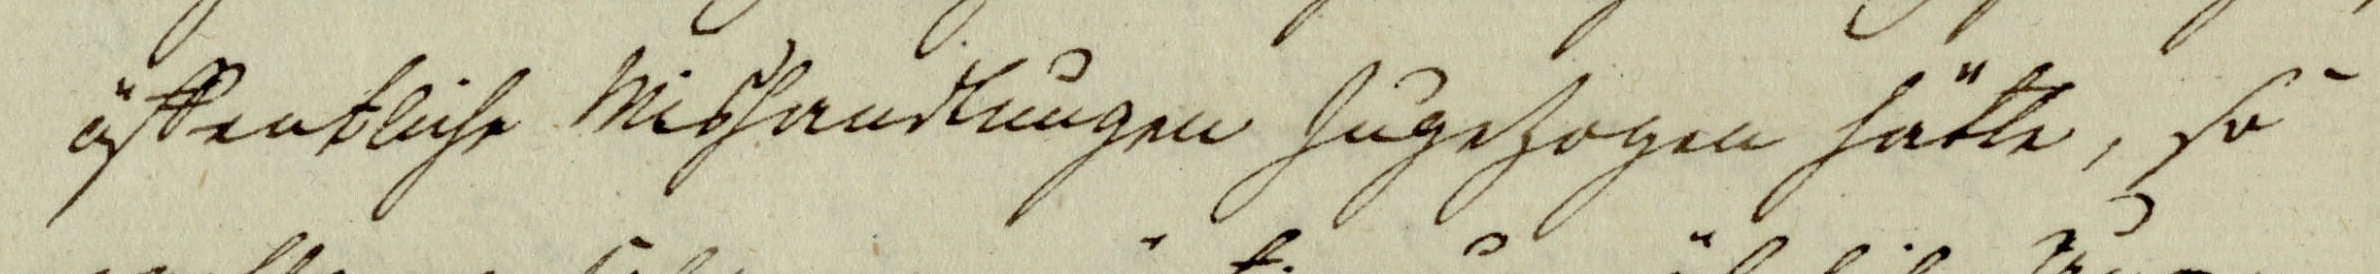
öffentliche Mishandlungen zugezogen hätte, so
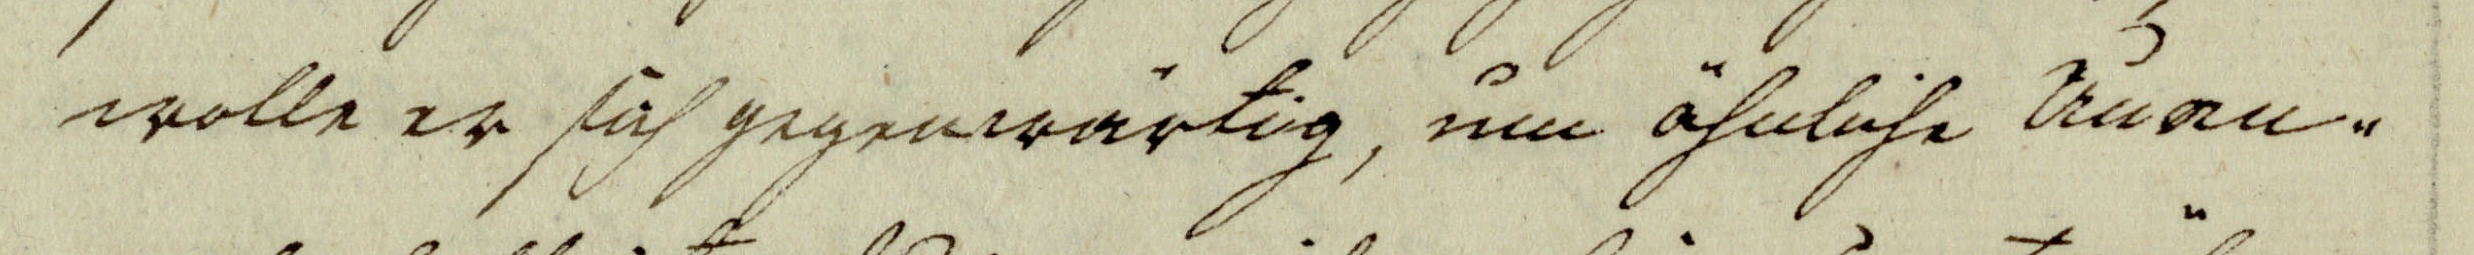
wolle er sich gegenwärtig, um ähnliche Unan¬
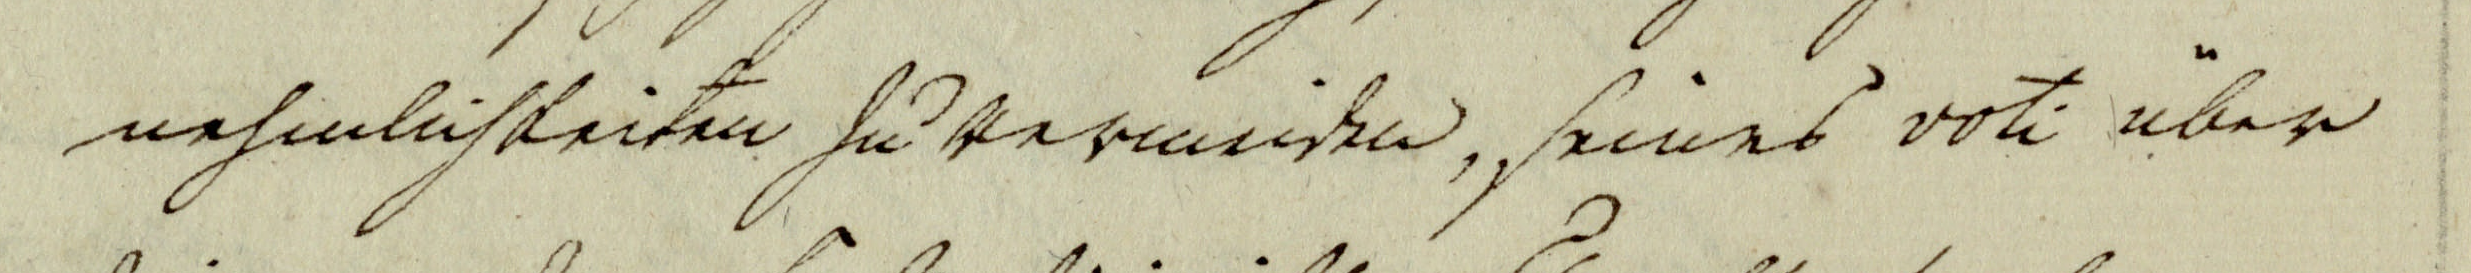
nehmlichkeiten zu vermeiden, seines voti über
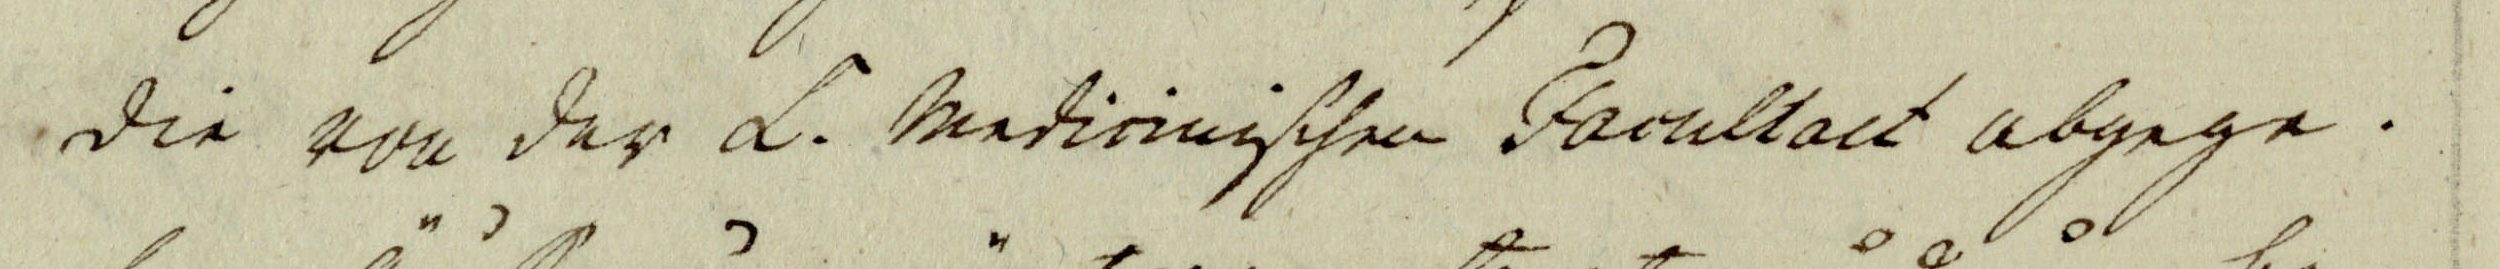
die von der L. Medicinischen Facultaet absgege¬
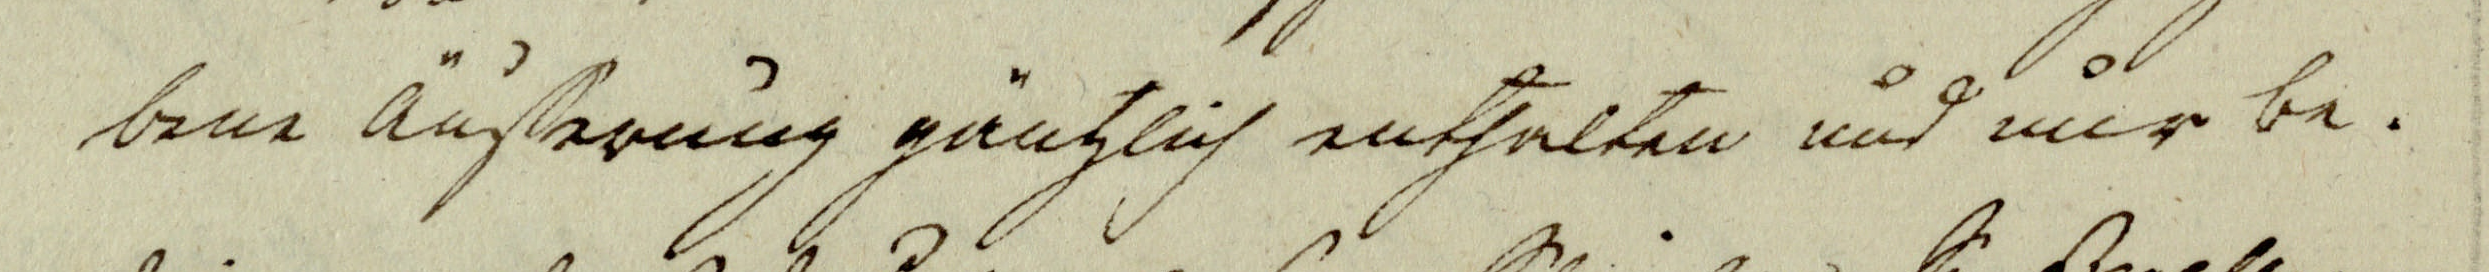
bene Äusserung gäntzlich enthalten und nur be¬
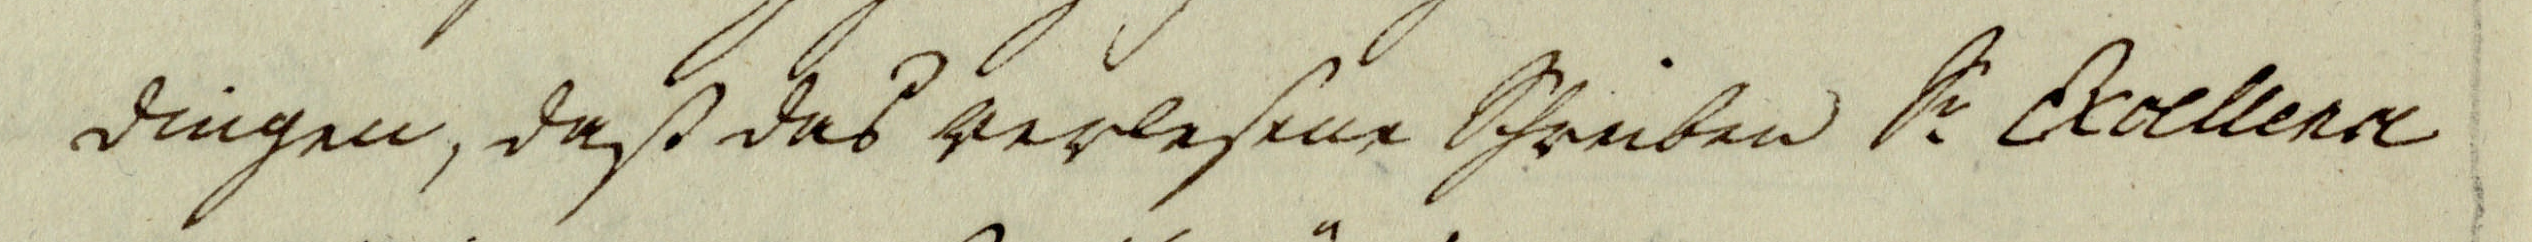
dingen, daß das verlesene Schreiben Sr Excellence
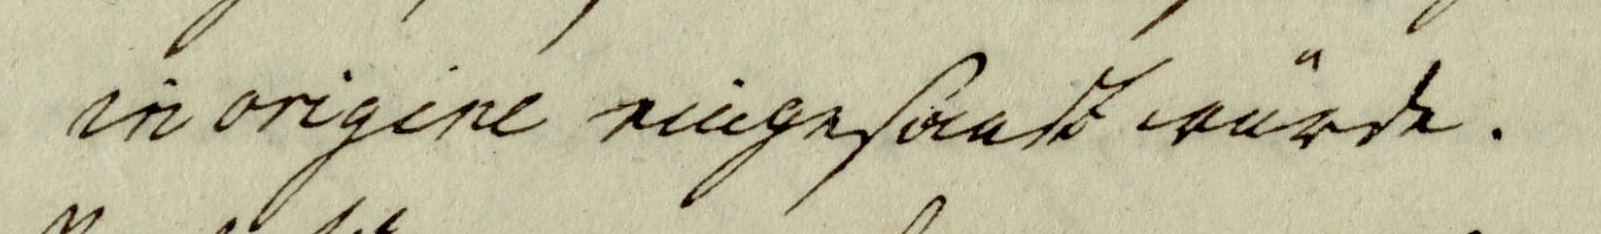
in origine eingesandt würde.
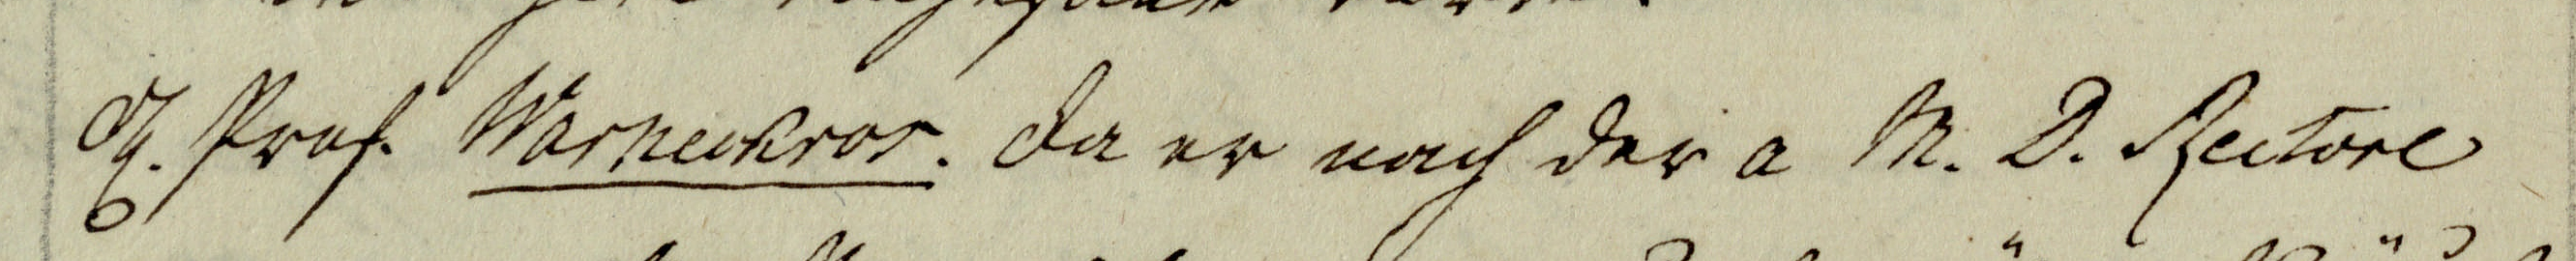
dh. Prof. Warneckros. Da er nach der a M. D. Rectore
